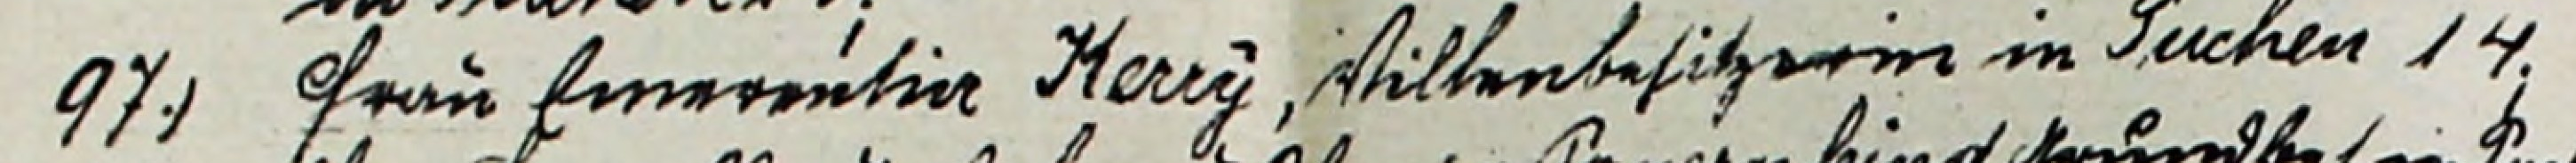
97.) Frau Emerentia Kerrÿ, Villenbesitzerin in Puchen 14;
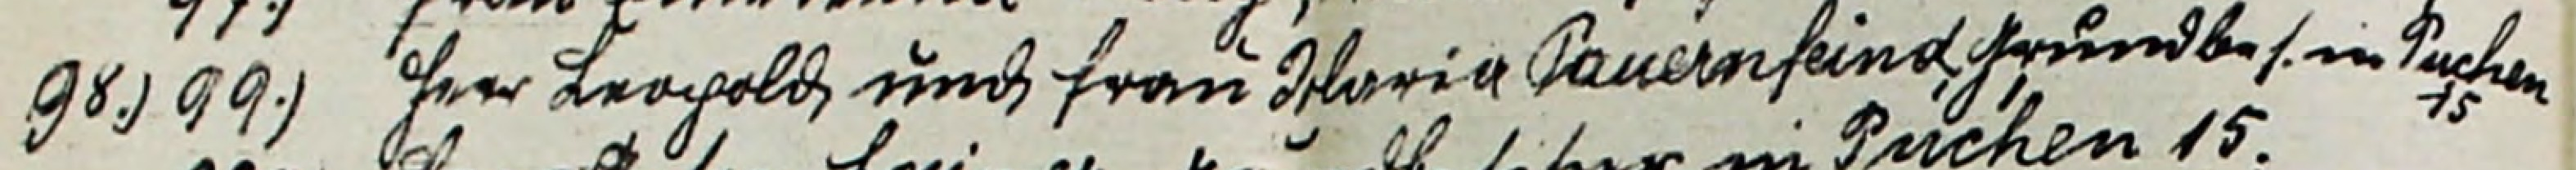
98.) 99.) Herr
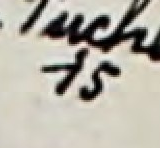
15
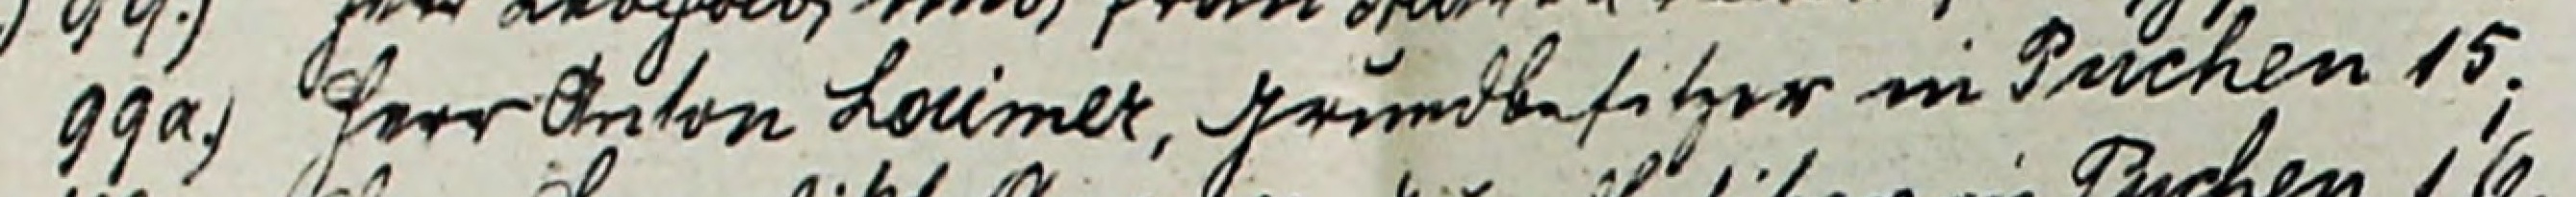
Leopold und Frau Maria Pauernfeind, Grundbes. in Puchen 15
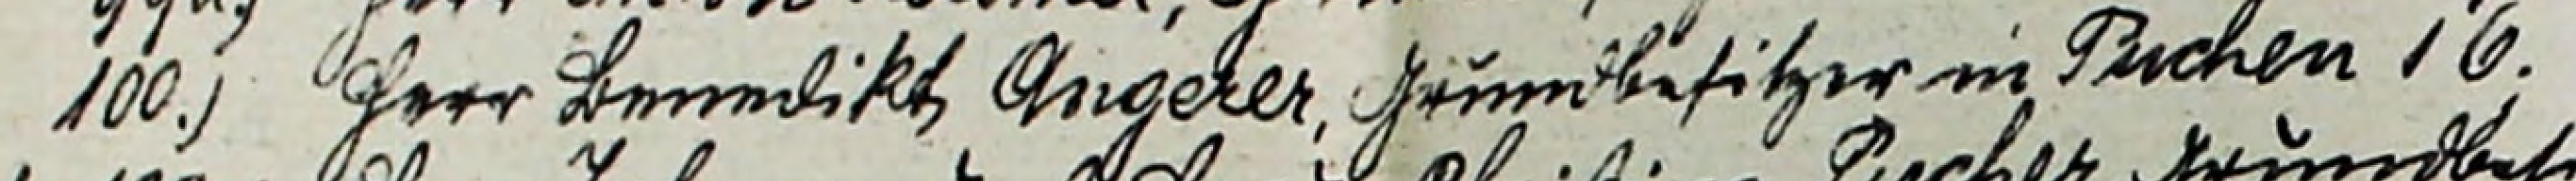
99a.) Herr Anton Laimer, Grundbesitzer in Puchen 15;
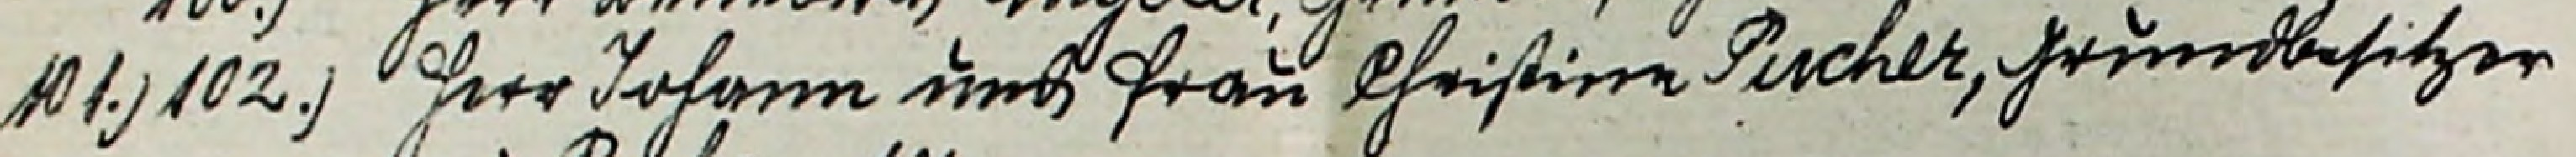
100.) Herr Benedikt Angerer, Grundbesitzer in Puchen 16;
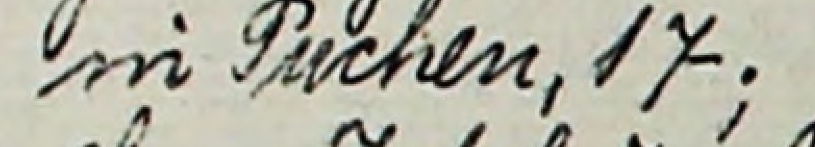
101.) 102.) Herr Johann und Frau Christine Pucher, Grundbesitzer
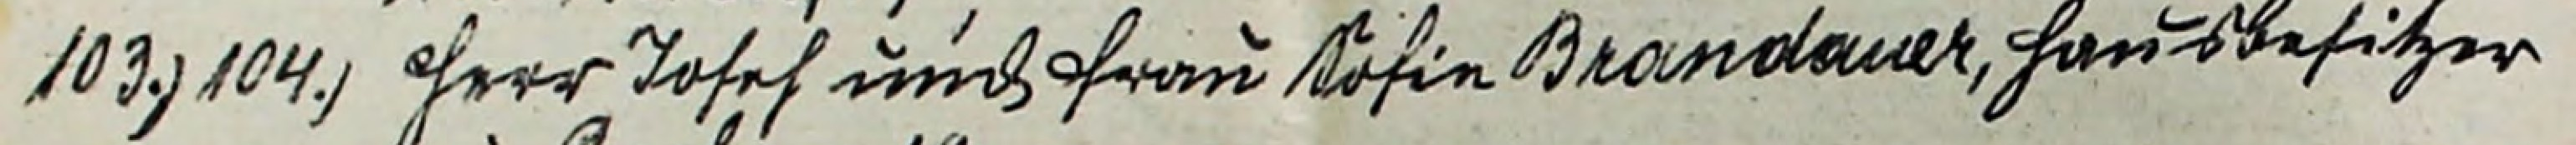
in Puchen, 17;
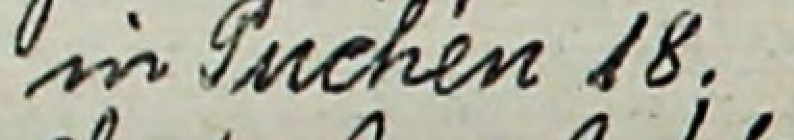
103.) 104.) Herr Josef und Frau Sofie Brandauer, Hausbesitzer
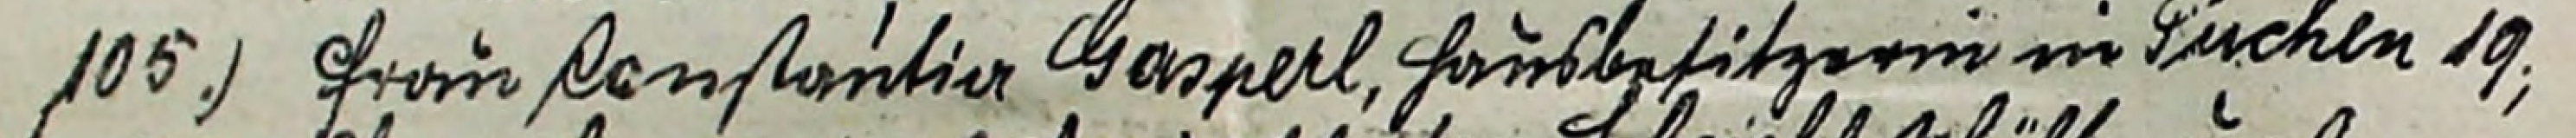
in Puchen 18;
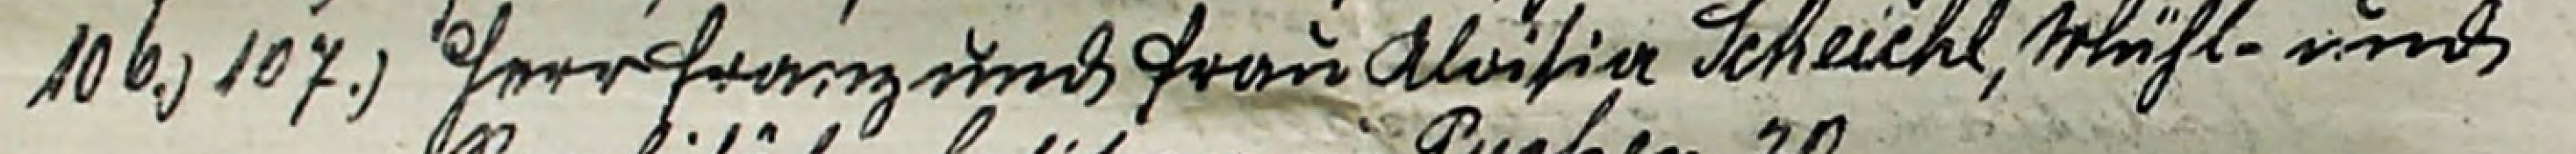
105.) Frau Constantia Gasperl, Hausbesitzerin in Puchen 19;
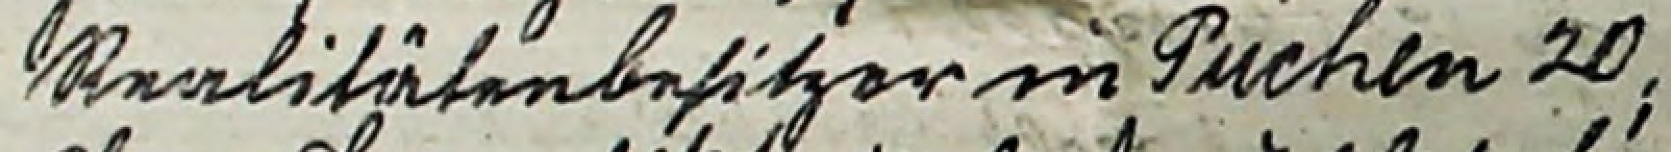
106.) 107.) Herr Franz und Frau Aloisia Scheichl, Mühl- und
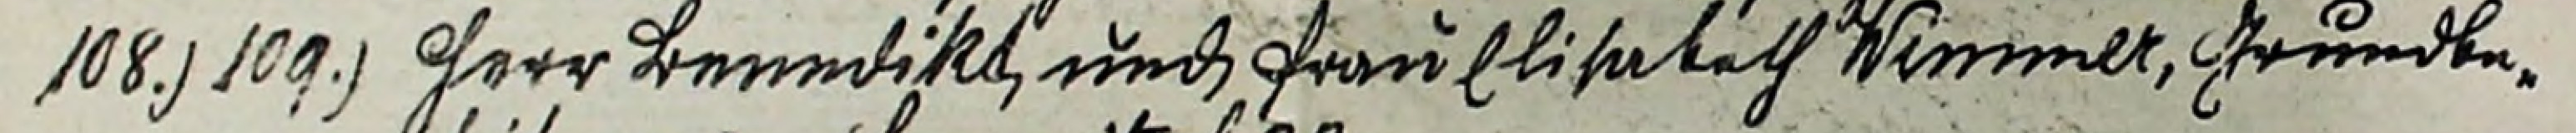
Realitätenbesitzer in Puchen 20;
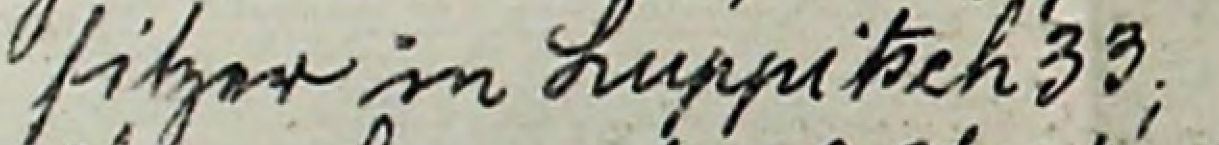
108.) 109.) Herr Benedikt und Frau Elisabeth Wimmer, Grundbe„
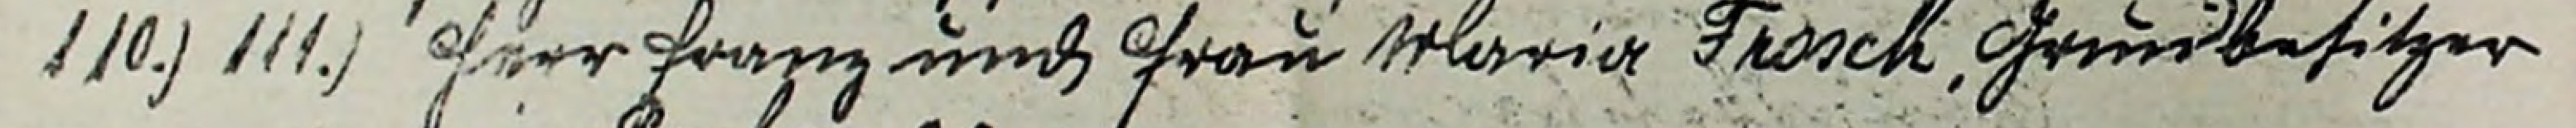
sitzer in Luppitsch 33;
